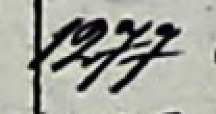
1277
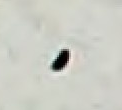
.
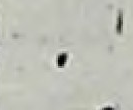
.
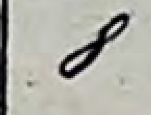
8
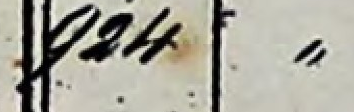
924 „
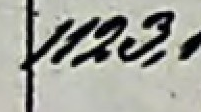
1123,1
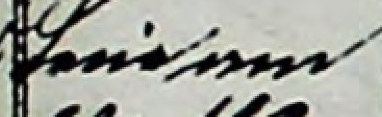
Svein am
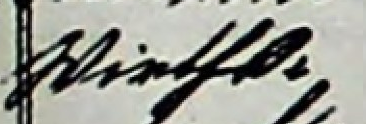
Wirths„
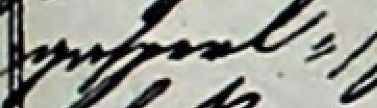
gasperl„
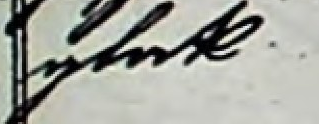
glak
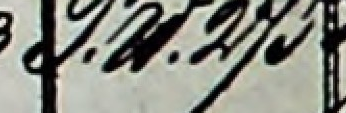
P.W. 275
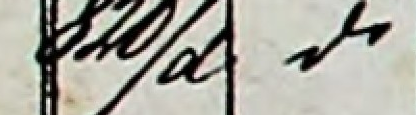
820/d do
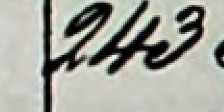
243
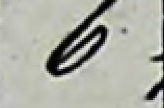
6
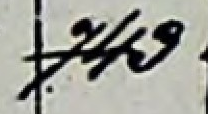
743
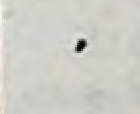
.
